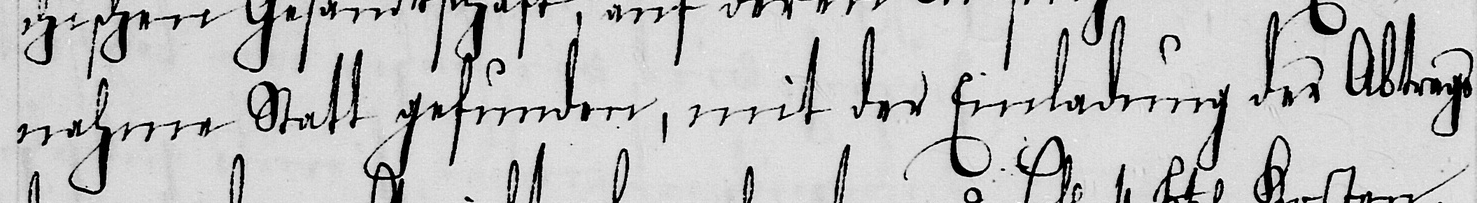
nahme Statt gefunden, mit der Einladung des Abtrags
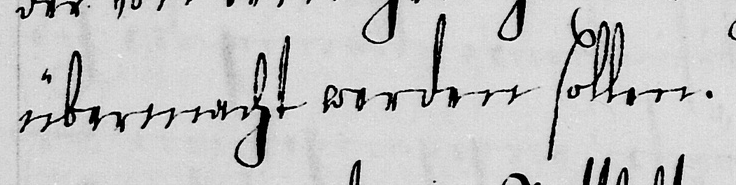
übermacht werden sollen.
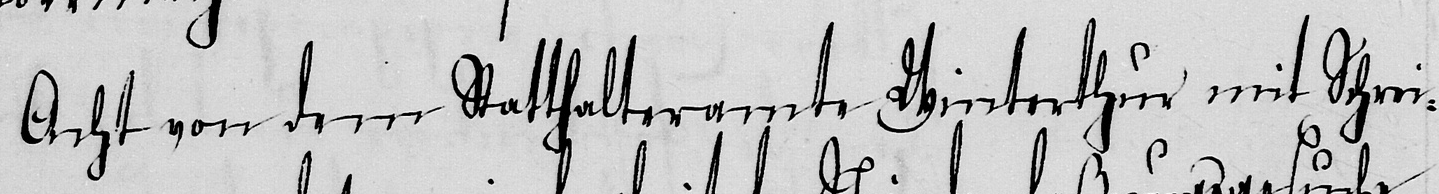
Acht von dem Statthalteramte Winterthur mit Schrei¬
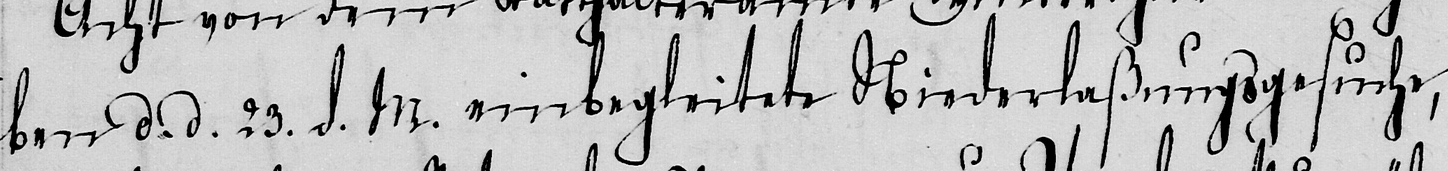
ben d. d. 23. d. M. einbegleitete Niederlaßungsgesuche,
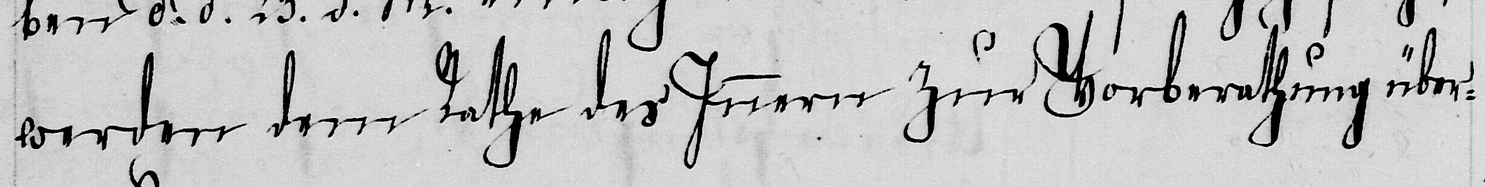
werden dem Rathe des Innern zur Vorberathung über¬
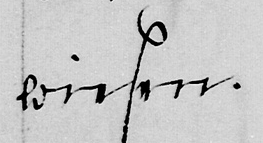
wiesen.
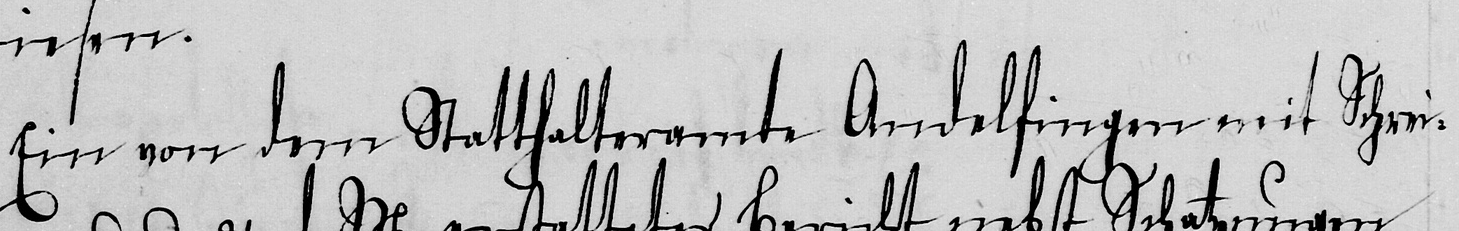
Ein von dem Statthalteramte Andelfingen mit Schrei¬
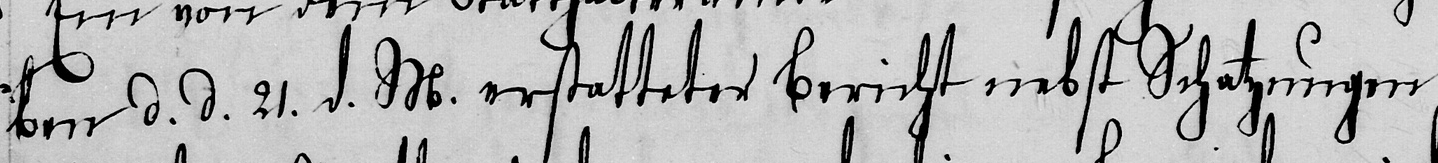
ben d. d. 21. d. M. erstatteter Bericht nebst Schatzungen
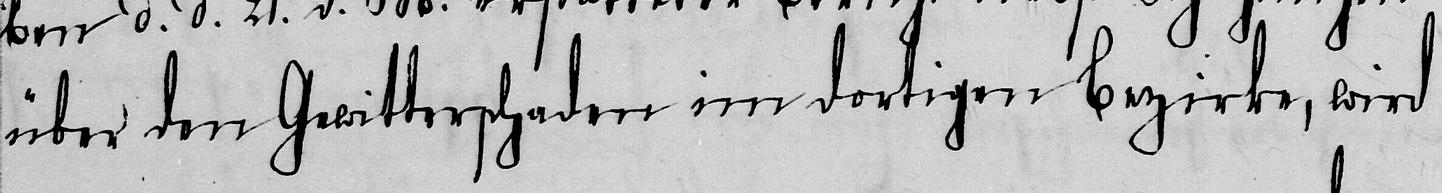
über den Gewitterschaden im dortigen Bezirke, wird
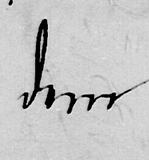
der
